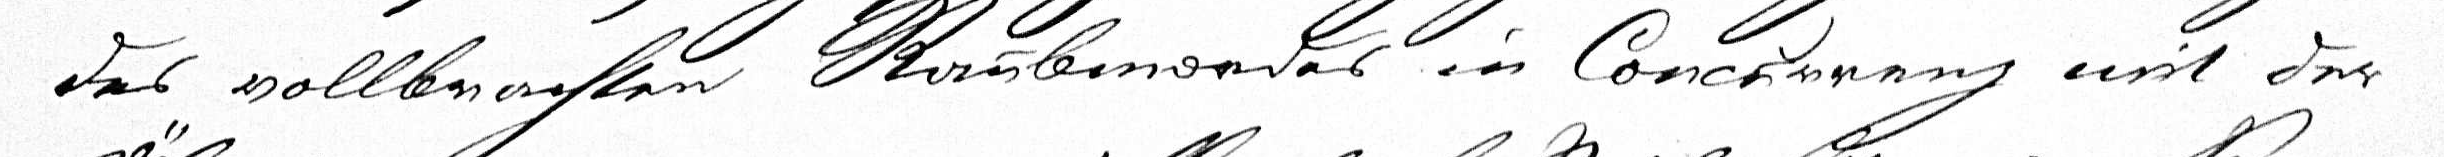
des vollbrachten Raubmordes in Concurrenz mit der
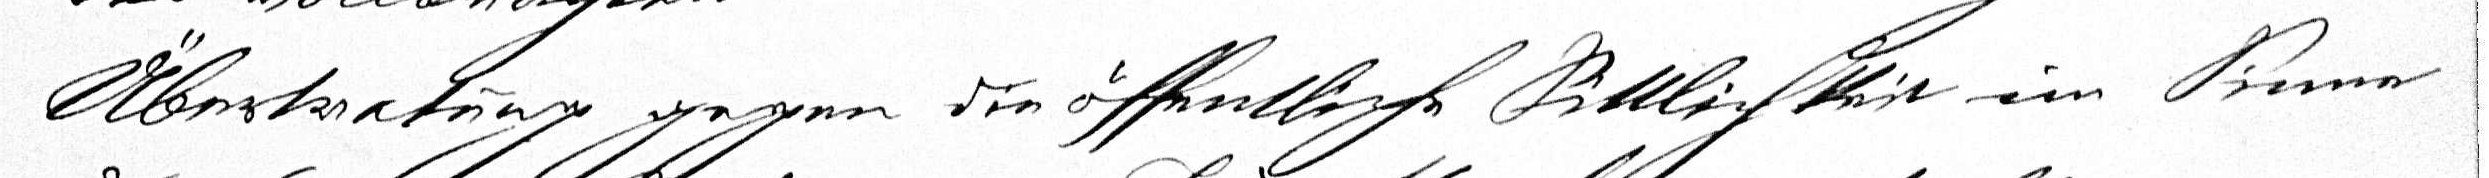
Übertretung gegen die öfftentliche Sittlichkeit im Sinne
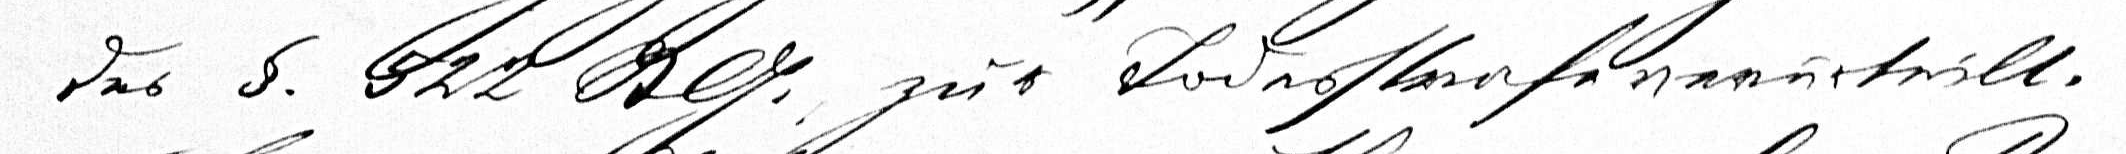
des §522 StG, zur Todesstrafe verurteilt.
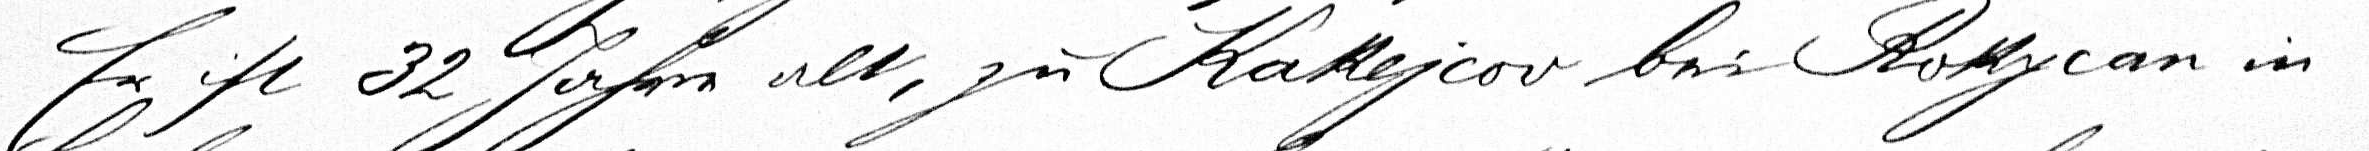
Er ist 32 Jahre alt, zu Kakejcov bei Rokycan in
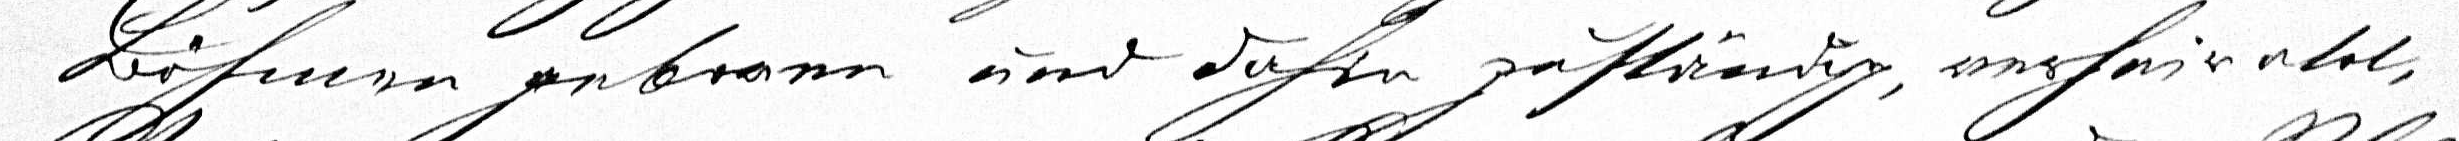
Böhmen geboren und dahin zuständig, verheiratet,
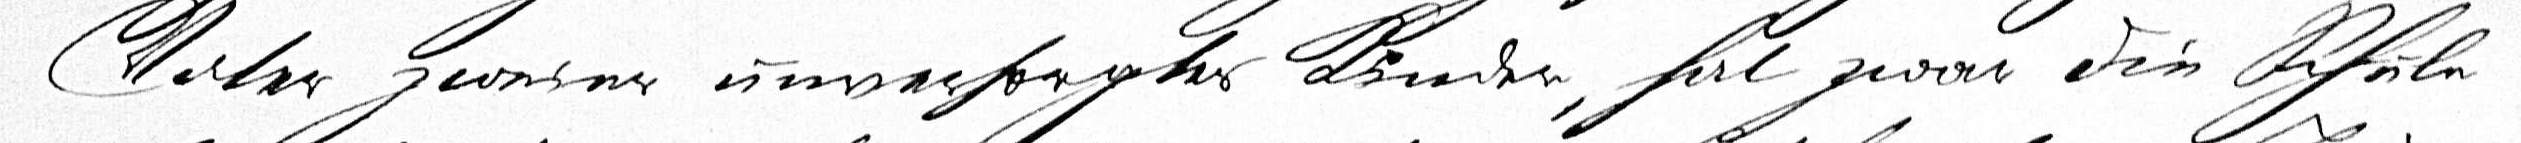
Vater zweier unversorgter Kinder, hat zwar die Schule
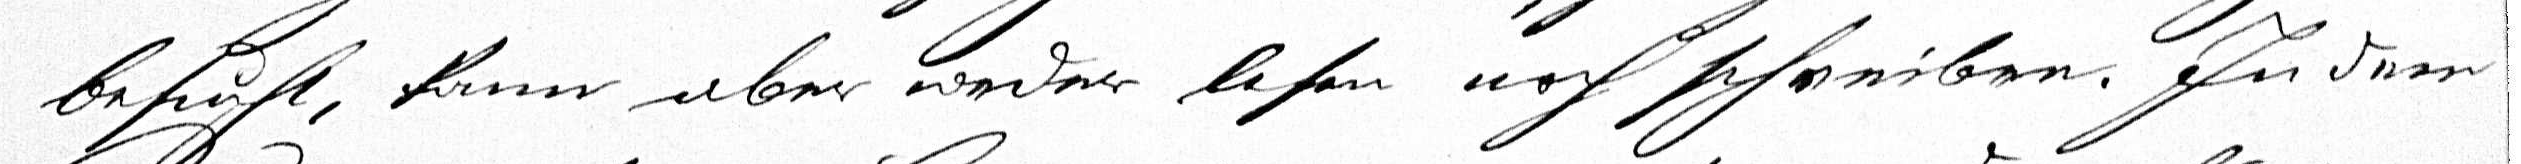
besucht, kann aber weder lesen noch schreiben. In dem
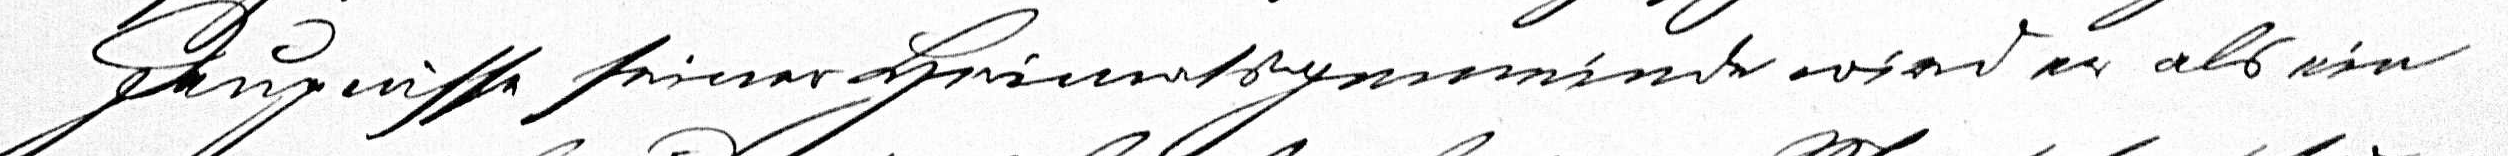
Zeugnisse seiner Heimatsgemeinde wird er als ein
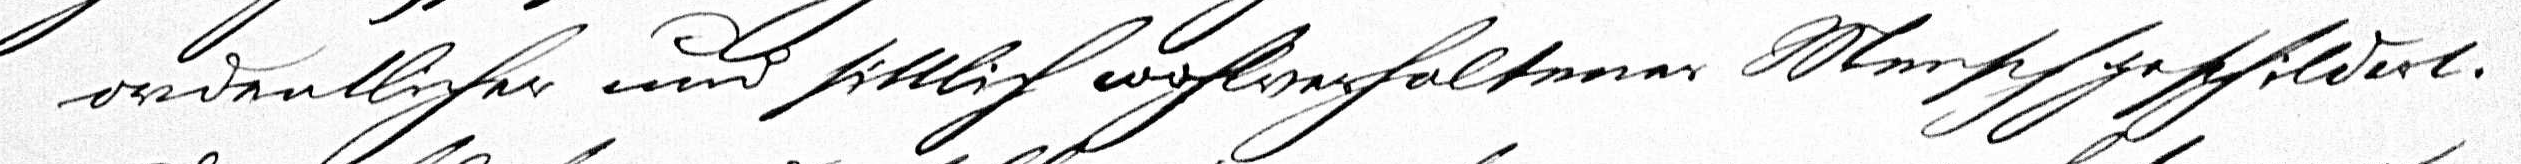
ordentlicher und sittlich wohlverhaltener Mensch geschildert.
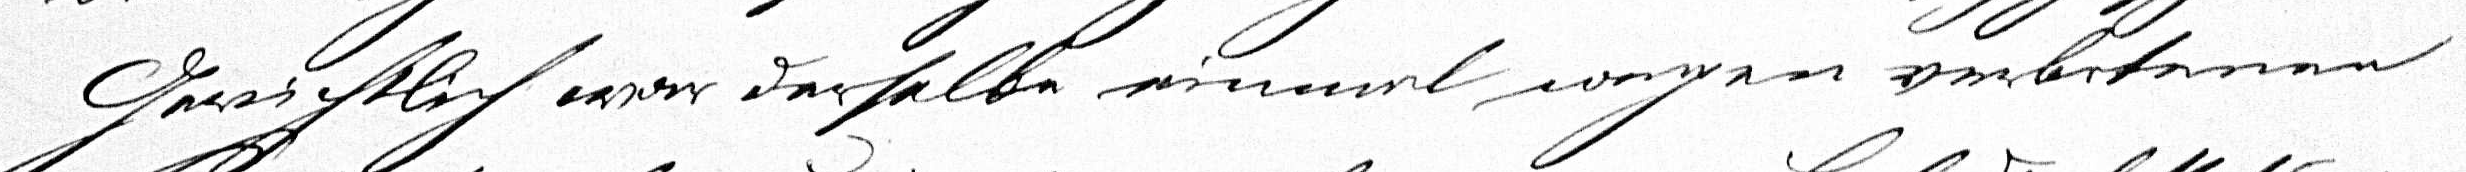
Gerichtlich war derselbe einmal wegen verbotenen
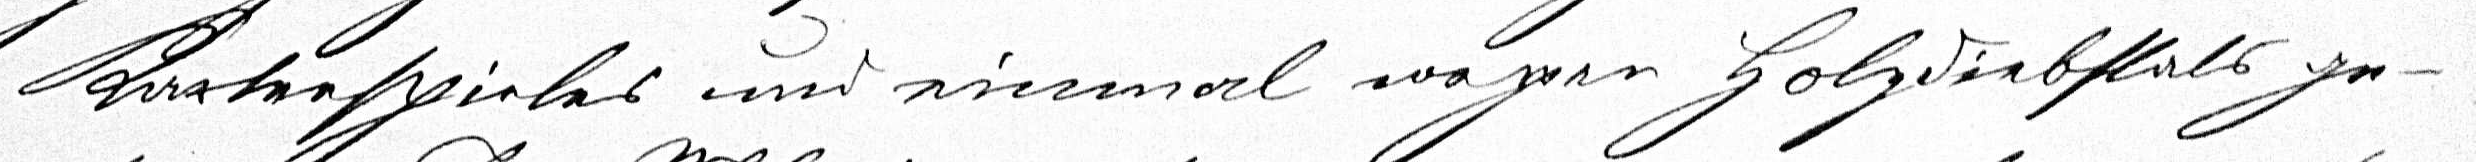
Kartenspieles und einmal wegen Holzdiebstals ge¬
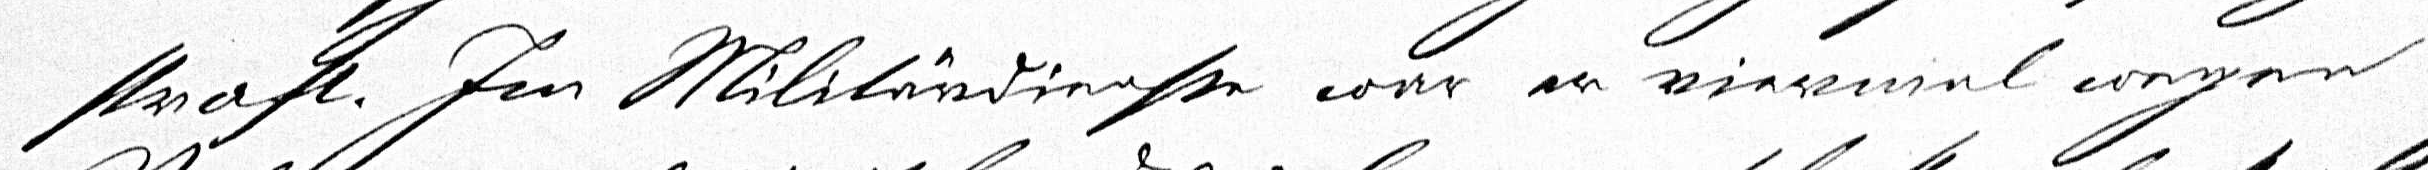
straft. Im Militärdienst war er viermal wegen
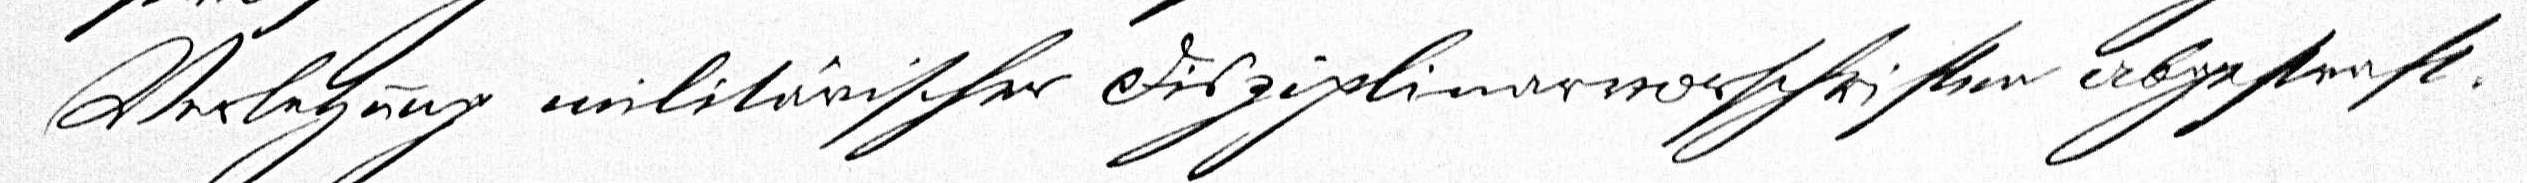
Verlegung militärischer Disziplinarvorschriften abgestraft.
